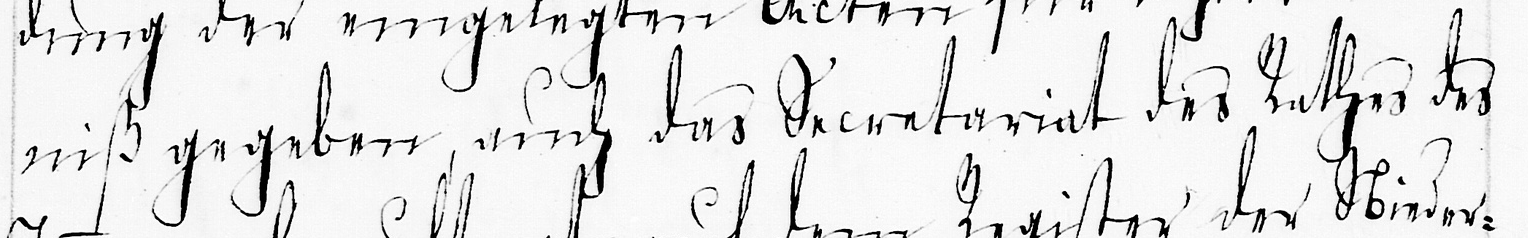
tniß gegeben, auch das Secretariat des Rathes des
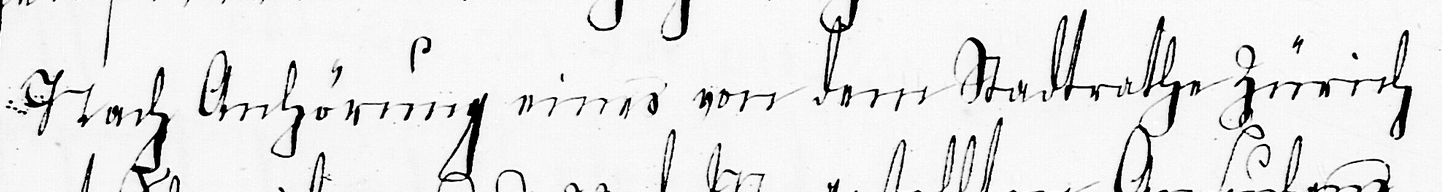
Nach Anhörung eines von dem Stadtrathe Zürich
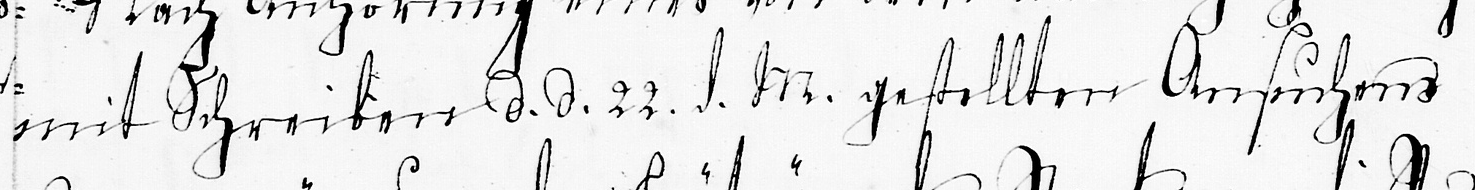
mit Schreiben d. d. 22. d. M. gestellten Ansuchens
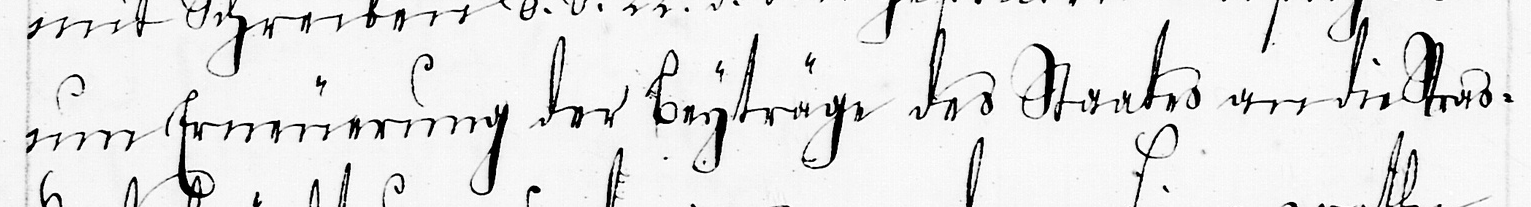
um Erneuerung der Beyträge des Staates an die Straß¬
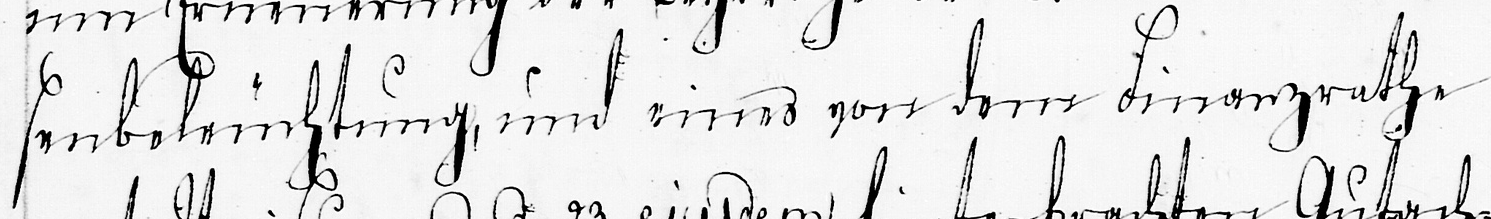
enbeleuchtung, und eines von dem Finanzrathe
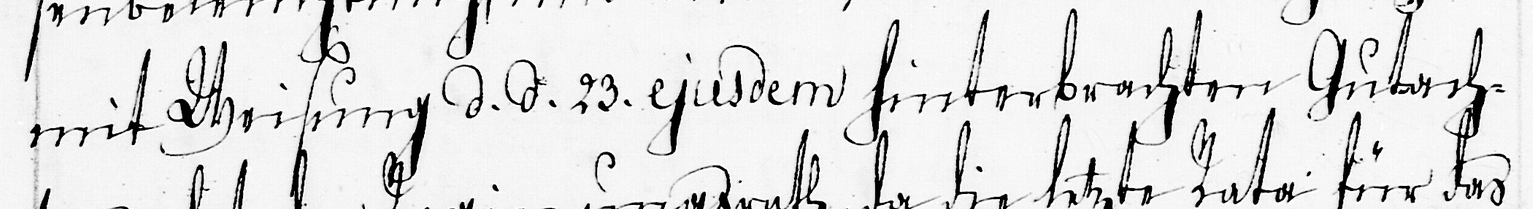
mit Weisung d. d. 23. ejusdem hinterbrachten Gutach¬
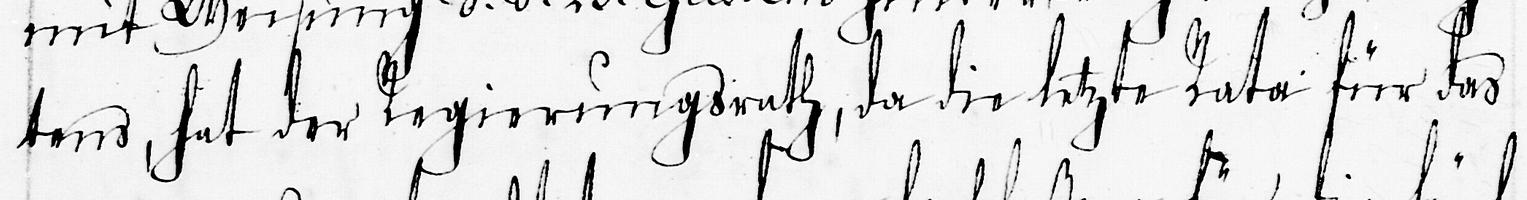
tens, hat der Regierungsrath, da die letzte Rata für das
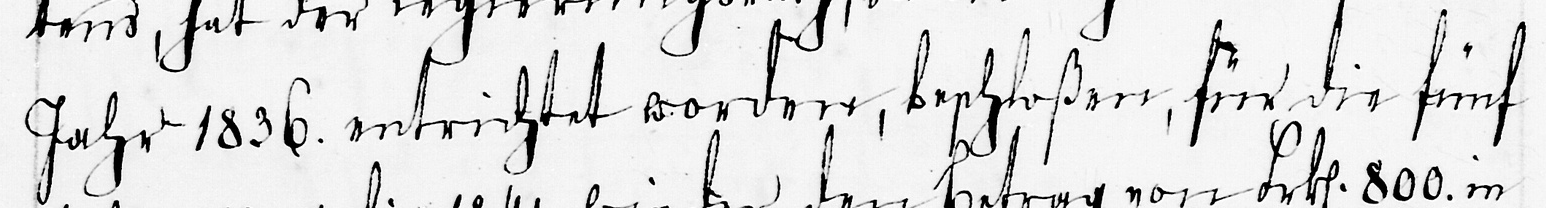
Jahr 1836. entrichtet worden, beschloßen, für die fünf
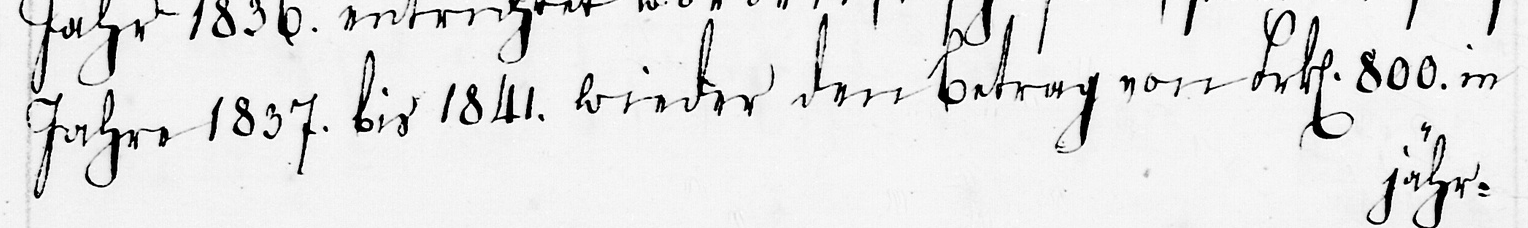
Jahre 1837. bis 1841. wieder den Betrag von Frk[en]. 800. in
